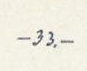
33
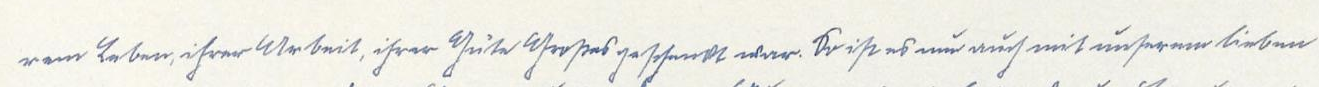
rem Leben, ihrer Arbeit, ihrer Güte Großes geschenkt war. So ist es nun auch mit unserem lieben
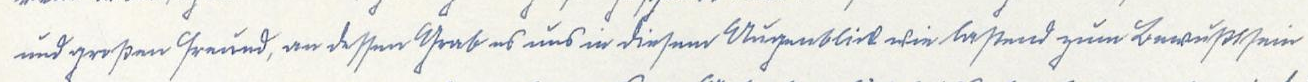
und großen Freund, an dessen Grab es uns in diesem Augenblick wie lastend zum Bewusstsein
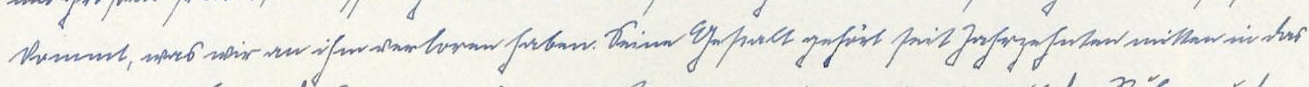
kommt, was wir an ihm verloren haben. Seine Gestalt gehört seit Jahrzehnten mitten in das
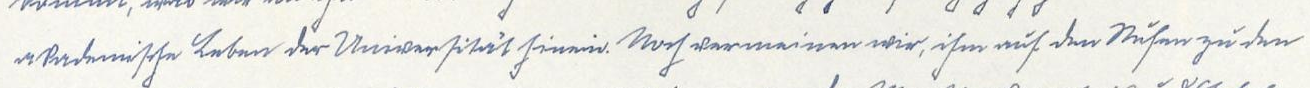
akademische Leben der Universität hinein. Noch vermeinen wir, ihm auf den Stufen zu den
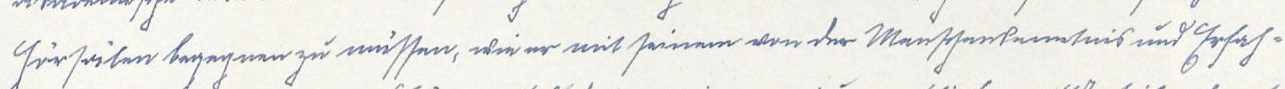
Hörsälen begegnen zu müssen, wie er mit seinem von der Menschenkenntnis und Erfahr-
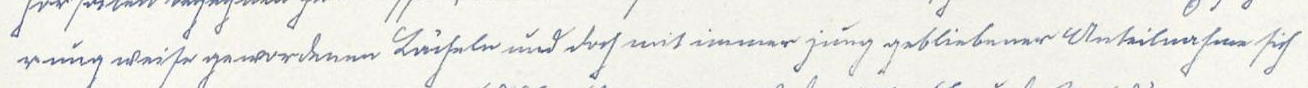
ung weise gewordenen Lächeln und doch mit immer jung gebliebener Anteilnahme sich
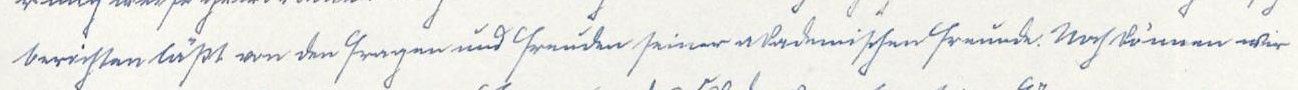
berichten lässt von den Fragen und Freuden seiner akademischen Freunde. Noch können wir
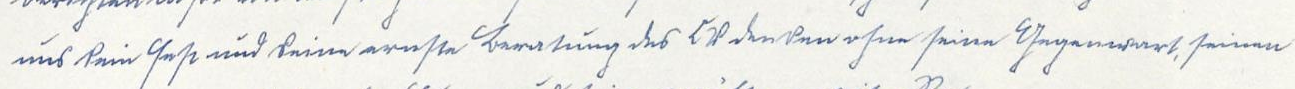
uns kein Fest und keine ernste Beratung des CV denken ohne seine Gegenwart, seinen
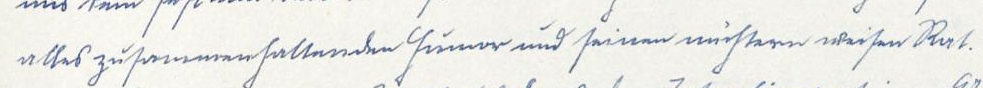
alles zusammenhaltenden Humor und seine nüchtern weisen Rat.
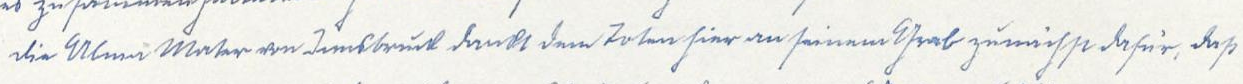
Die Alma Mater von Innsbruck dankt dem Toten hier an seinem Grab zunächst dafür, daß
